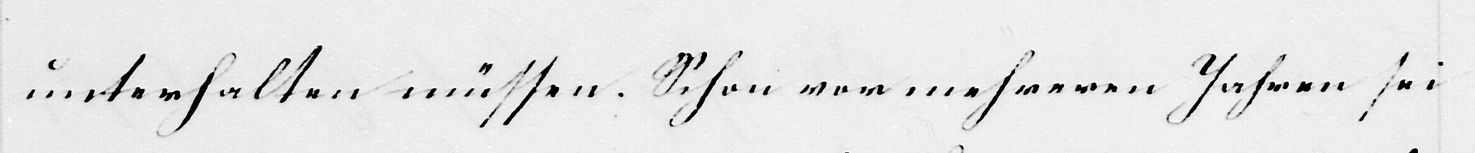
unterhalten müssen. Schon vor mehreren Jahren sei
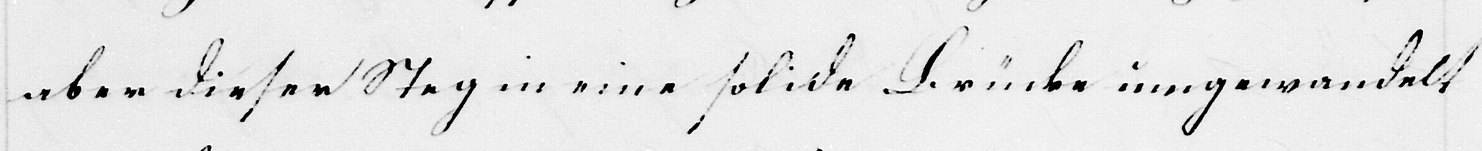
aber dieser Steg in eine solide Brücke umgewandelt
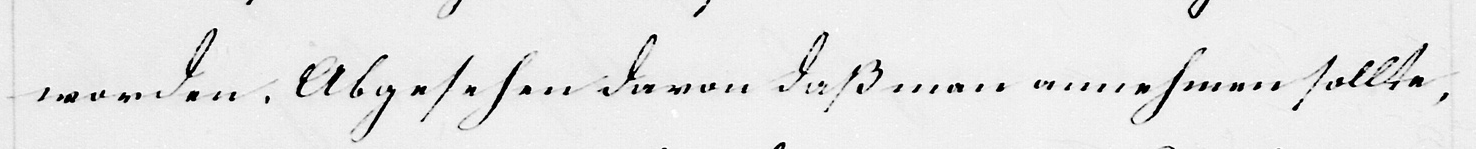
worden. Abgesehen davon daß man annehmen sollte,
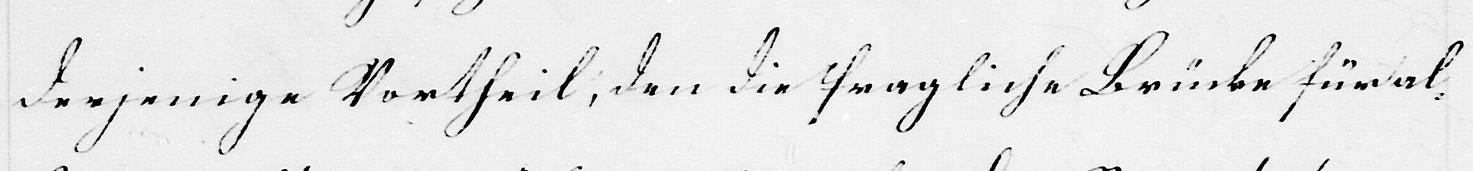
derjenige Vortheil, den die fragliche Brücke für al¬
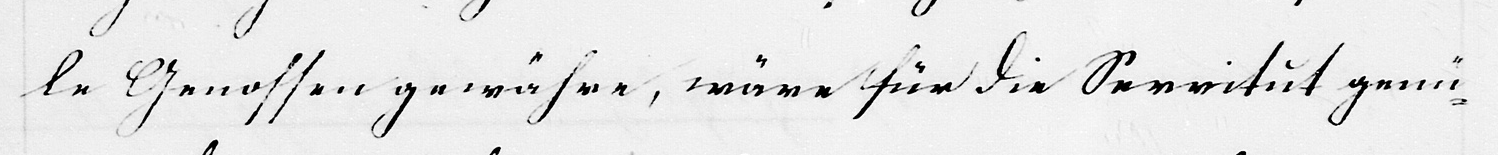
le Genossen gewähre, wäre für die Servitut genü¬
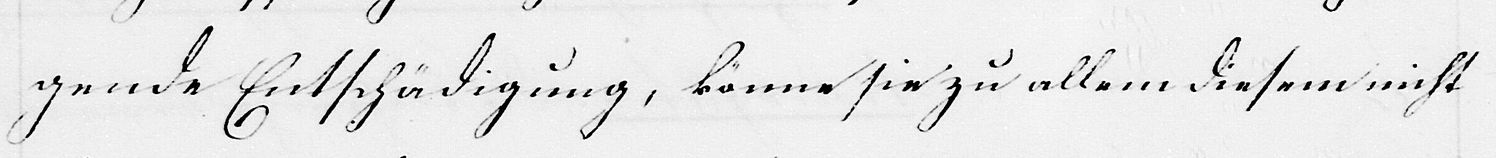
gende Entschädigung, könne sie zu allem diesem nicht
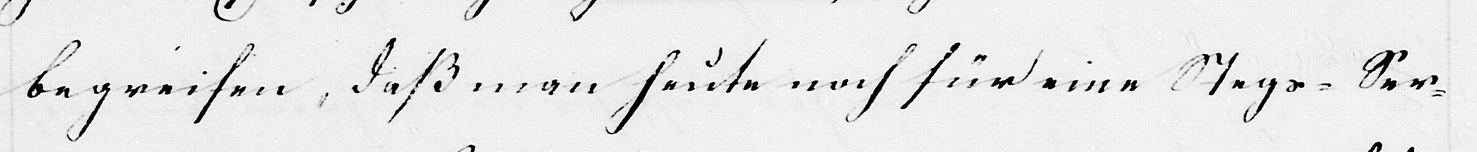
begreifen, daß man heute noch für eine Stegs-Ser¬
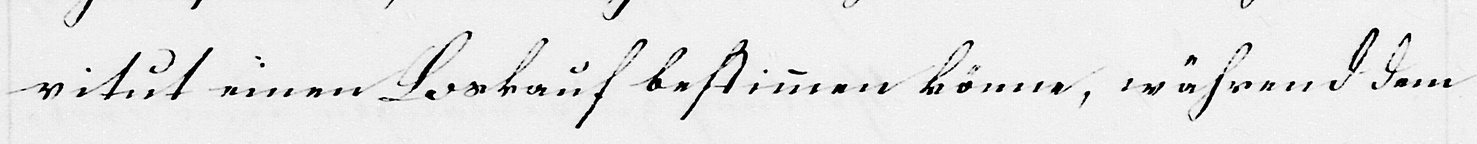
vitut einen Loskauf bestimmen könne, während dem
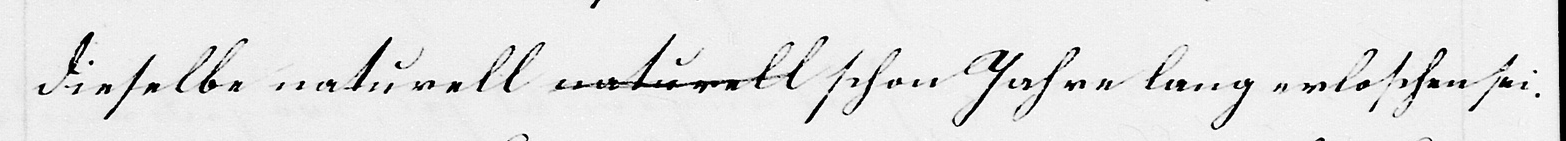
dieselbe naturell a-naturell-a schon Jahre lang erloschen sei.
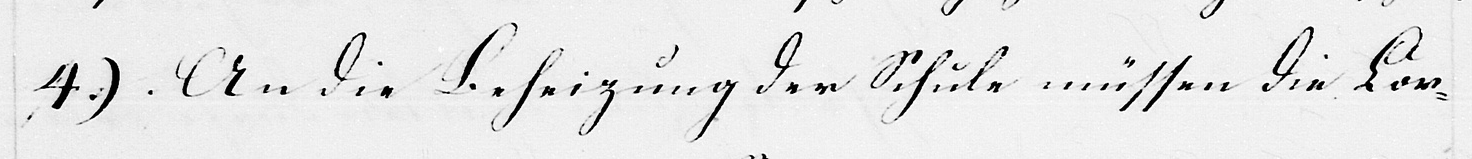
4.) An die Beheizung der Schule müssen die Cor¬
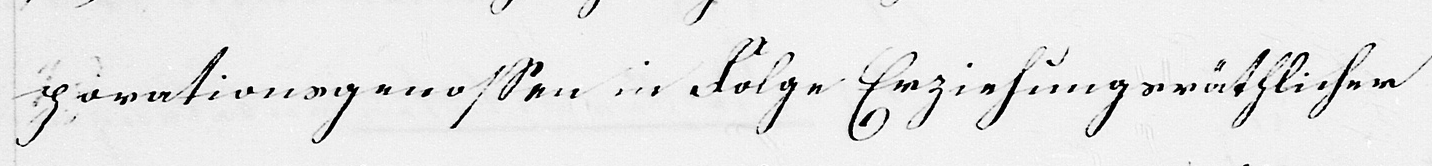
porationsgenoßen in Folge Erziehungsräthlicher
